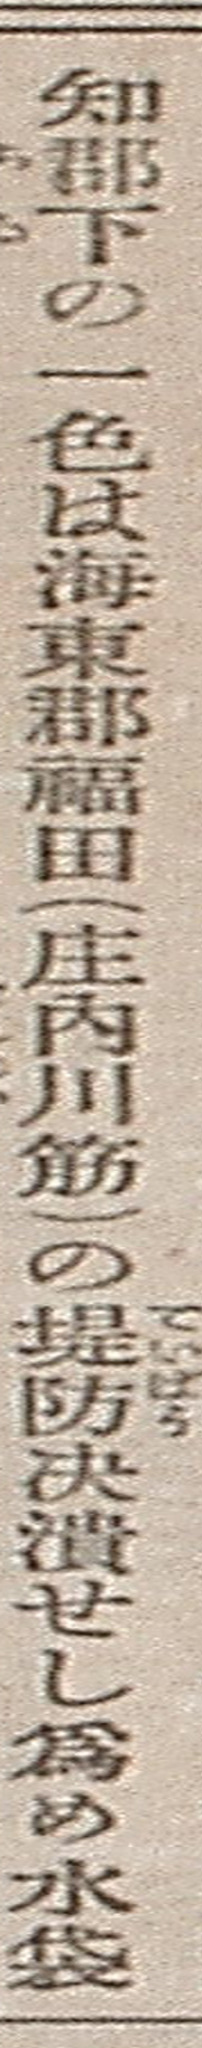知郡下の一色は海東郡福田の堤防决潰せし為め水袋
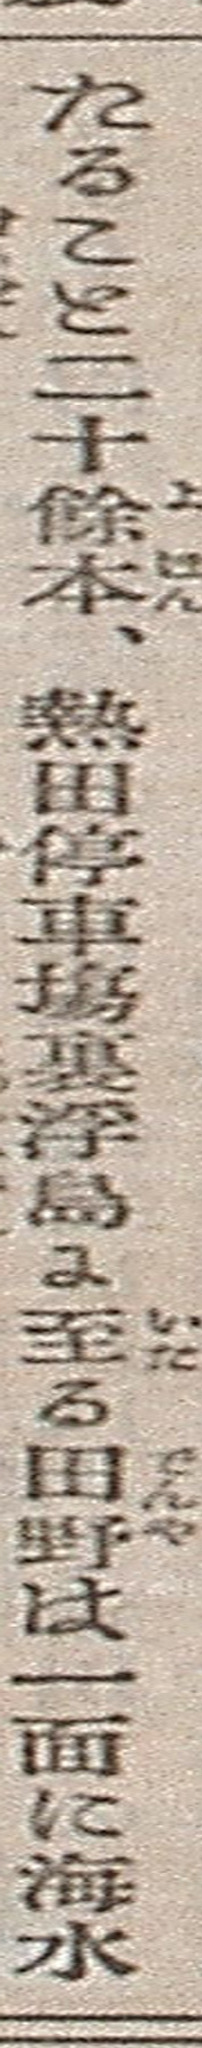たること二十餘本、熱田停車場裏浮島に至る田野は一面に海水
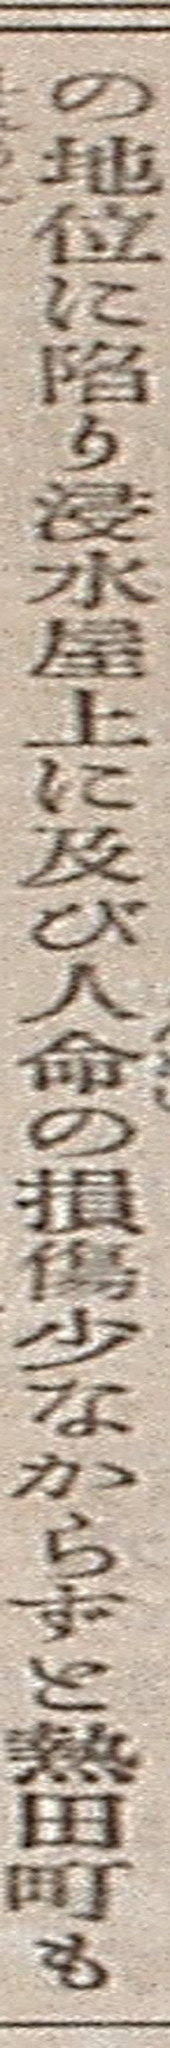の地位に陥り浸水屋上に及び人命の損傷少なからずと熱田町も
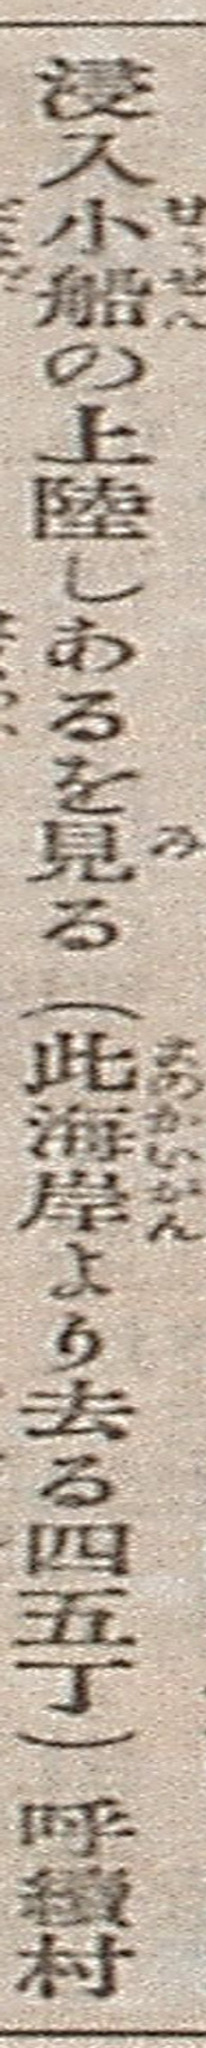侵入小船の上陸しあるを見るより去る四五丁）呼続村
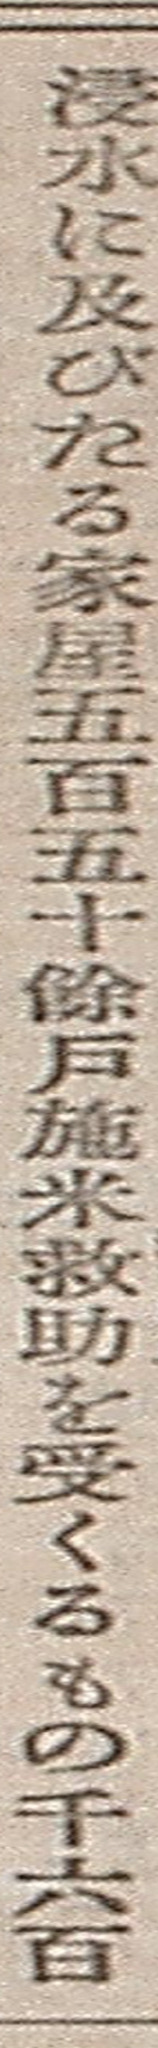浸水に及びたる家屋五百五十餘戸施米救助を受くるもの千六百
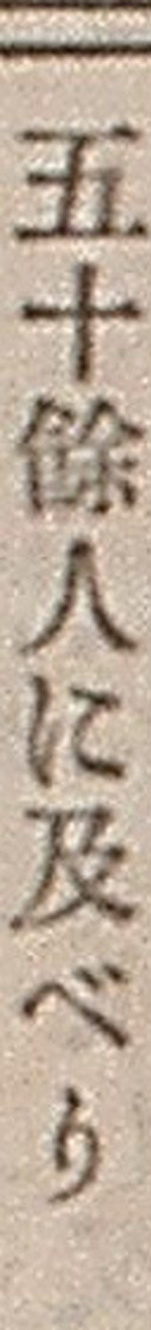五十餘人に及べり
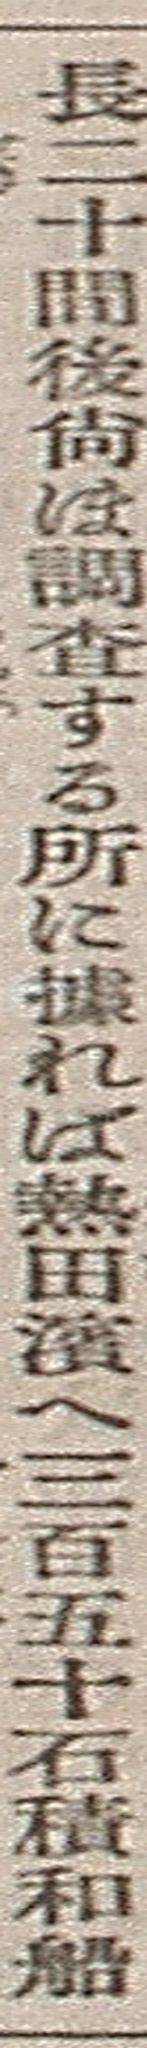長二十間後尚ほ調査する所に拠れば熱田浜へ三百五十石積和船
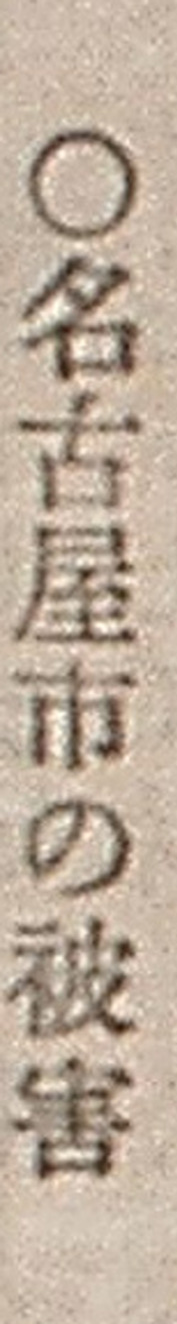◯名古屋市の被害
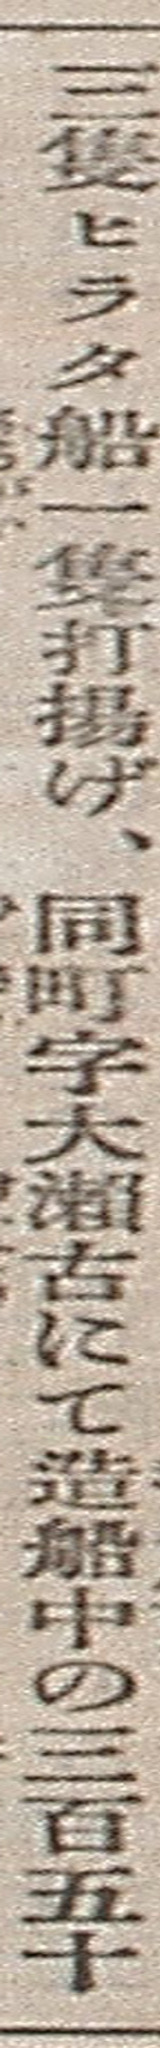三隻ヒラタ船一隻打揚げ、同町字大瀬古にて造船中の三百五十
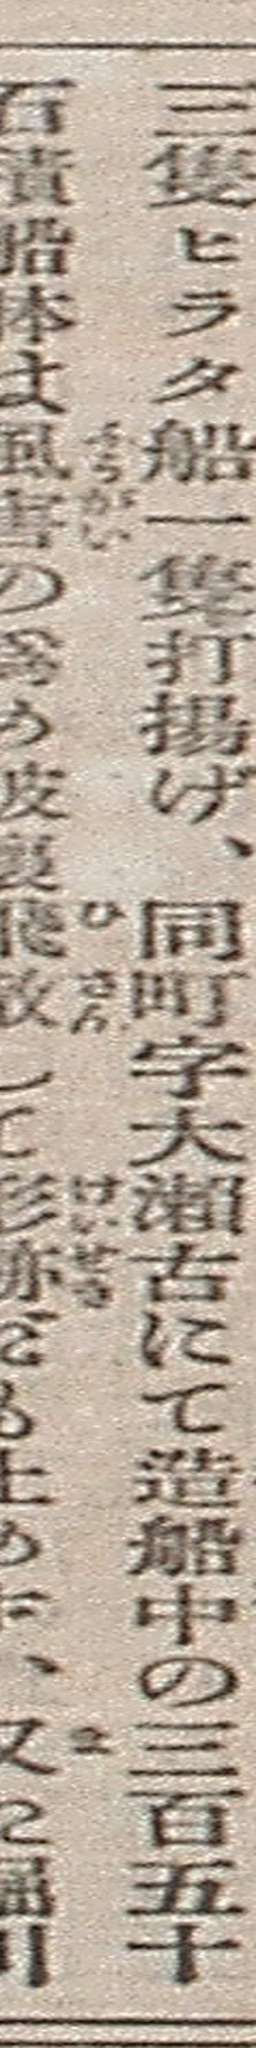石積船体は風害の為め破壊飛散して形跡だも止めず、又た堀川
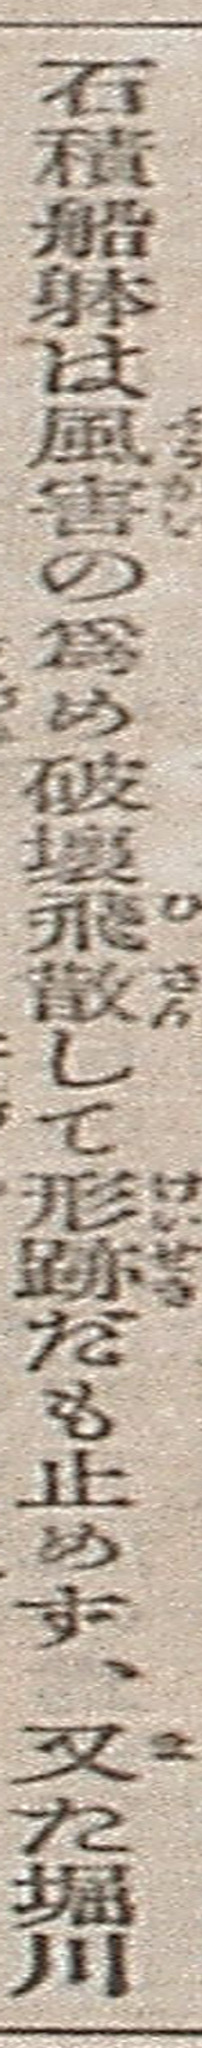石積船体は風害の為め破壊飛散して形跡だも止めず、又た堀川
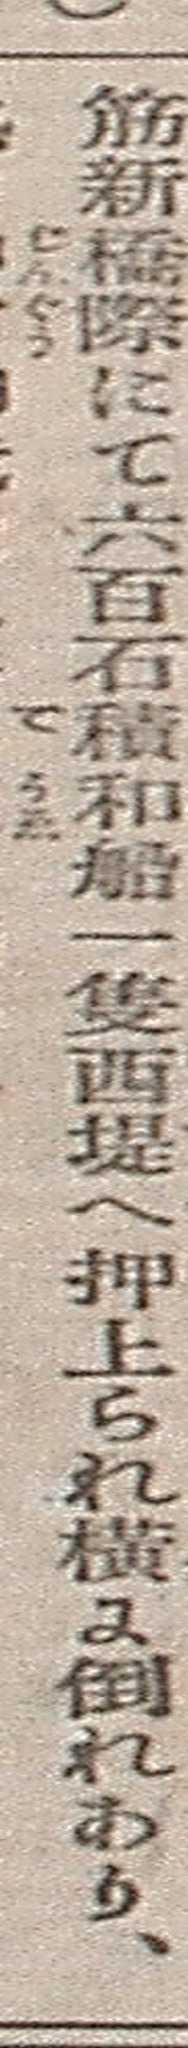筋新橋際にて六百石積和船一隻西堤へ押上られ横に倒れあり、
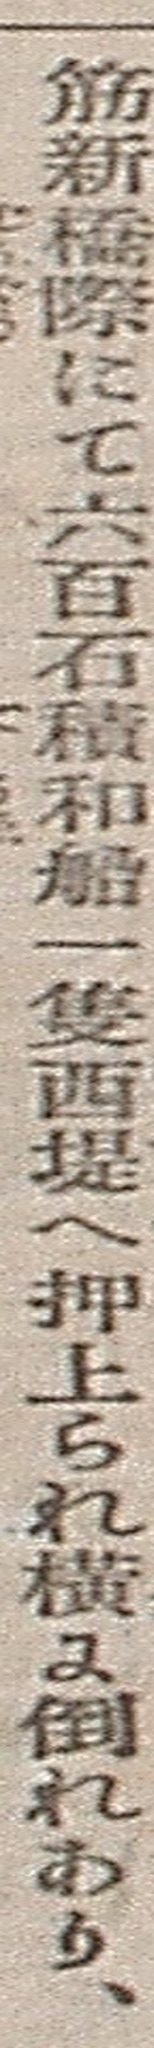筋新橋際にて六百石積和船一隻西堤へ押上られ横に倒れあり、
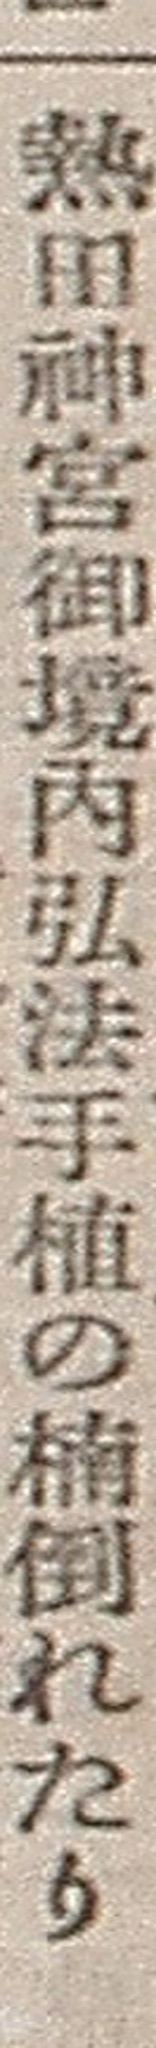熱田神宮御境内弘法手植の楠倒れたり
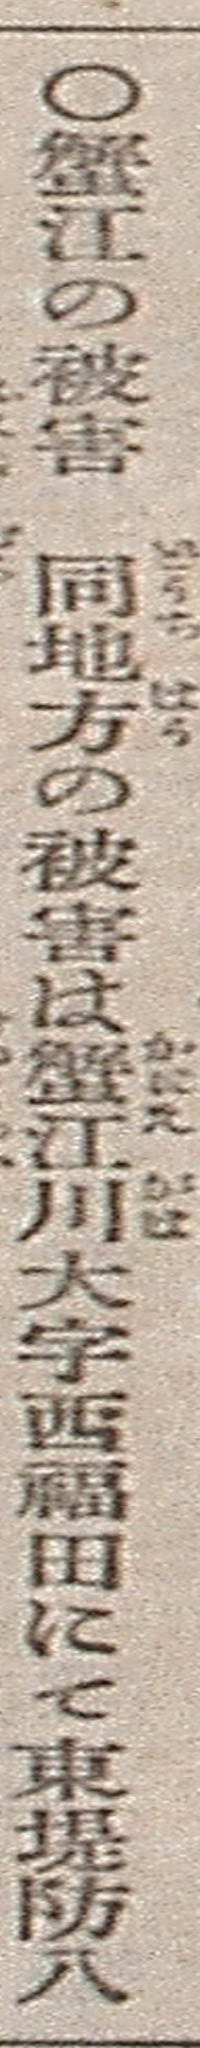◯蟹江の被害同地方の被害は蟹江川大字西福田にて東堤防八
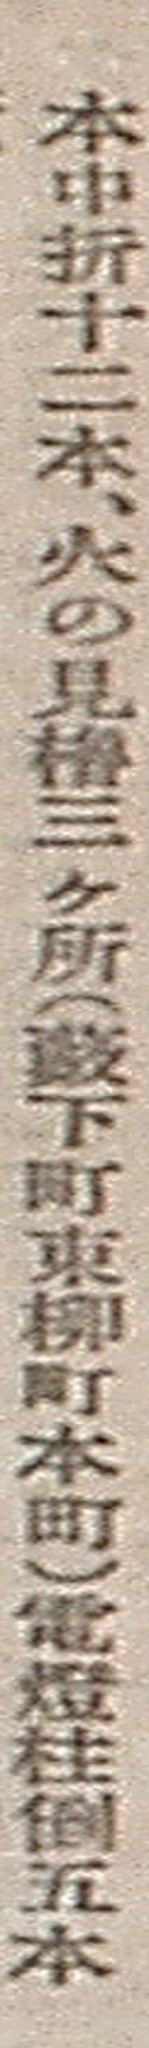本中折十二本、火の見櫓三ヶ所電燈柱倒五本
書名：風俗畫報臨時増刊第百二十六號　洪水被害録（中）
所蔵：東京大学地震研究所図書室 Earthquake Research Institute Library, The University of Tokyo, JAPAN
